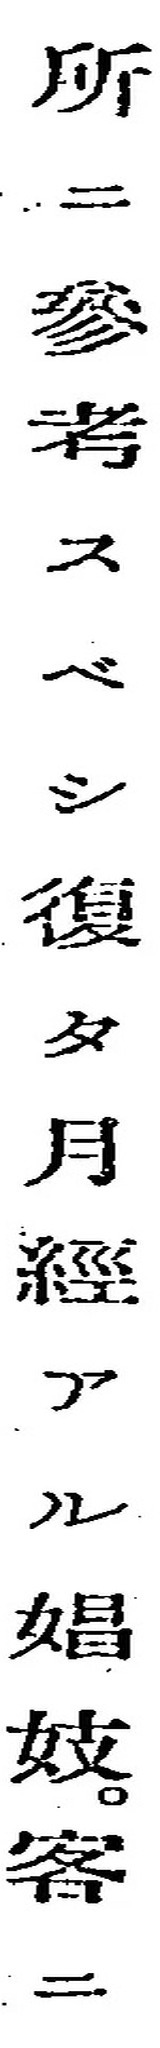所に参考すべし復た月経ある娼妓。客に
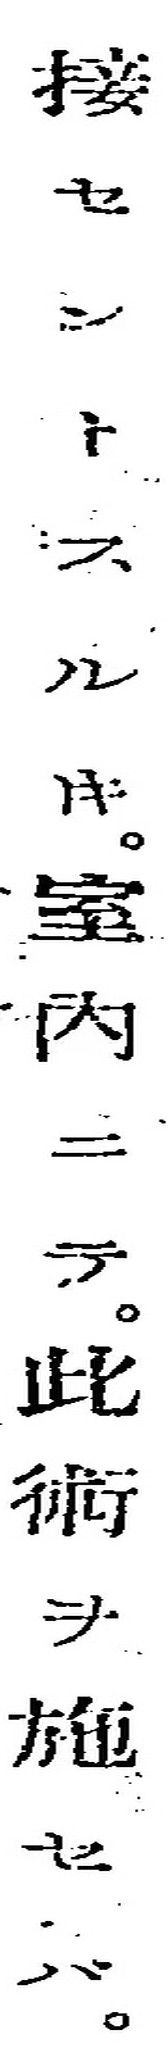接せんとするとき。室内にて。此術を施せば。
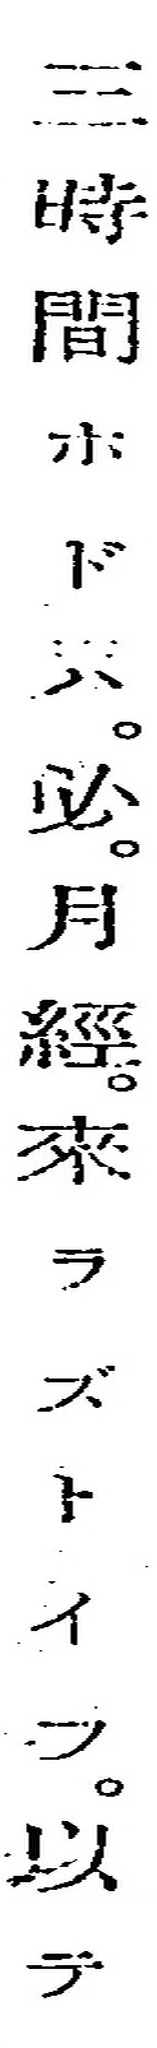三時間ほどは。必。月経。来らずといふ。以て
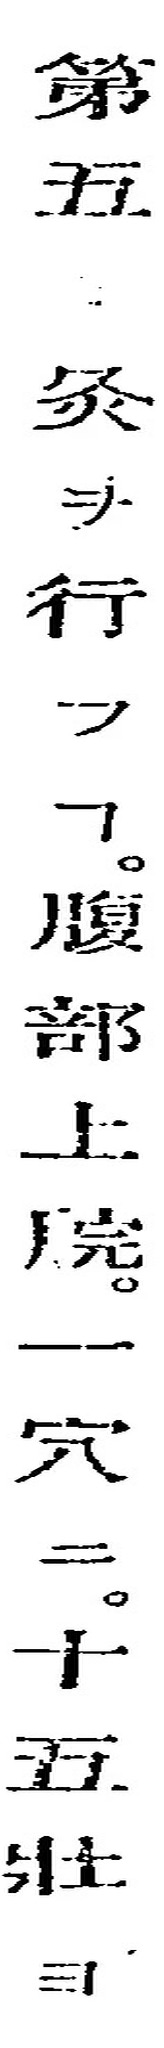第五灸を行うこと。腹部上脘。一穴に。十五壮よ
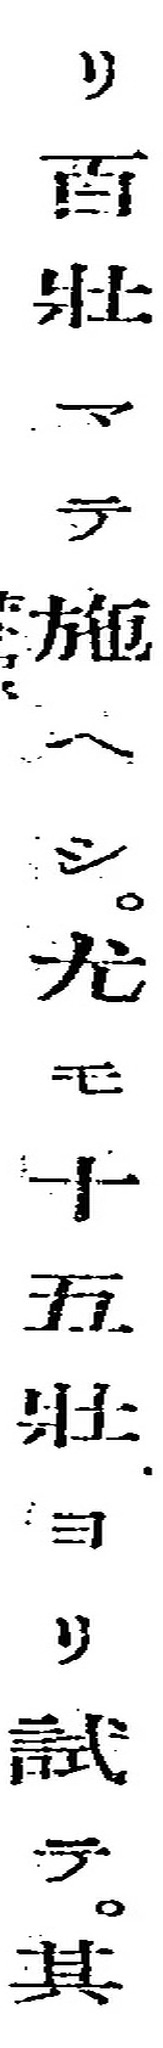り百壮まて施へし。尤も十五壮より試て。其
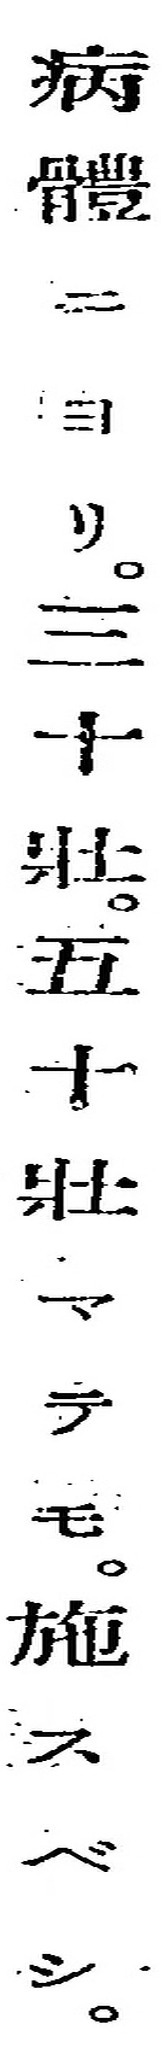病体により。三十壮。五十壮まても。施すべし。
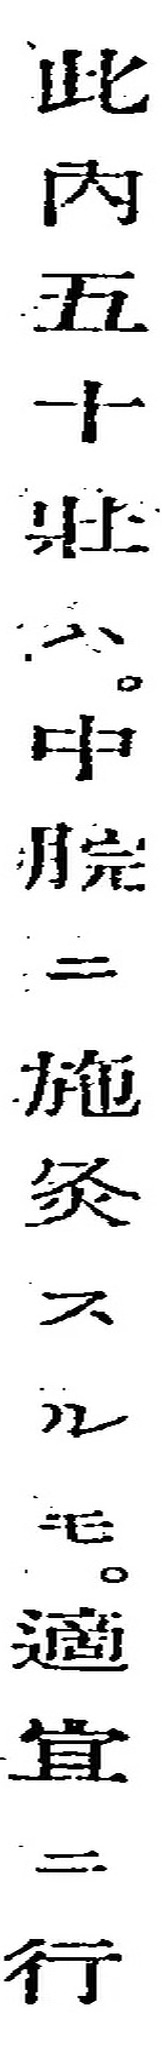此内五十壮は。中脘に施灸するも。適宜に行
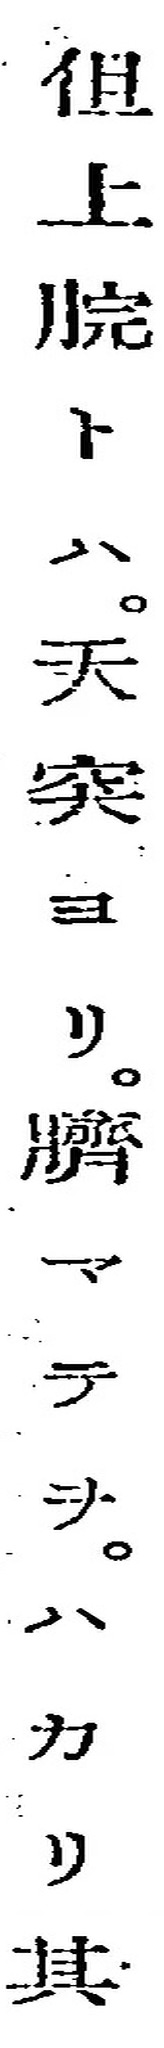但上脘とは。天突より。臍まてを。はかり其
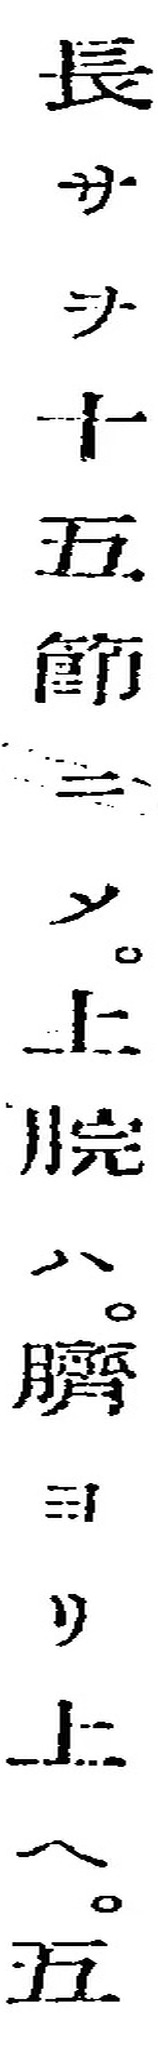長さを十五節にして。上脘は。臍より上へ。五
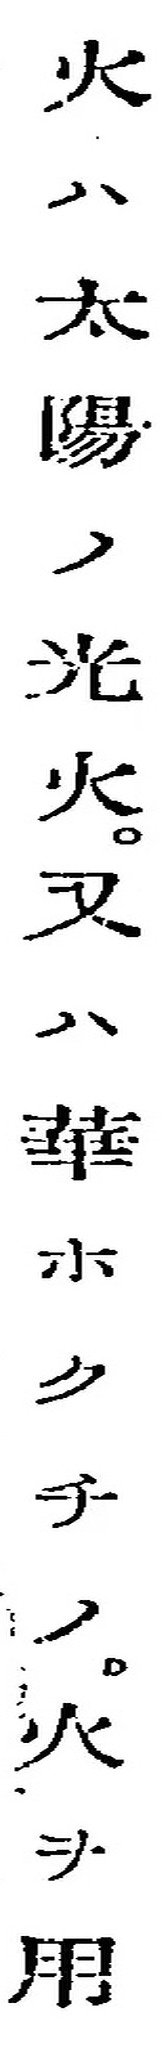火は太陽の光火。又は華ほくちの。火を用
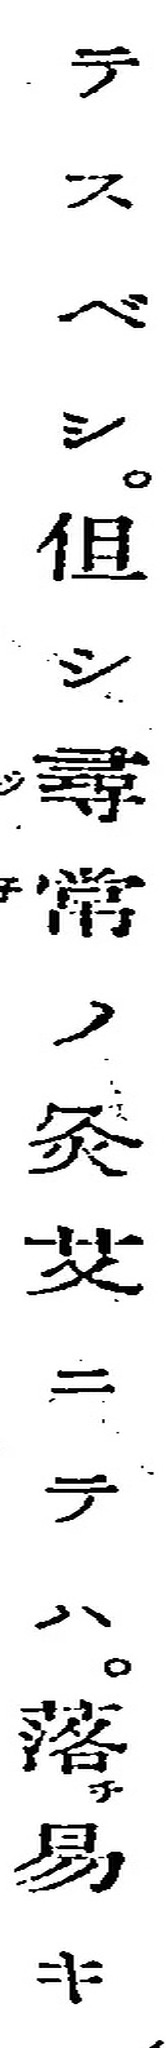てすべし。但し尋常の灸艾にては。落ち易き
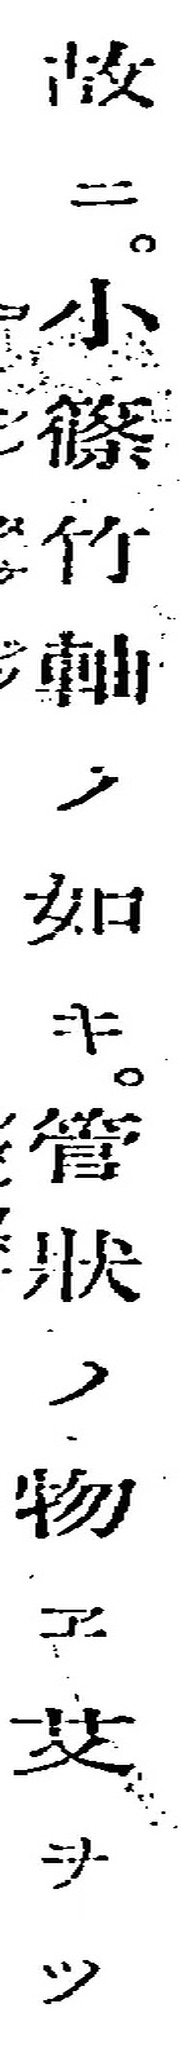故に。小篠竹軸の如き。管状の物ゑ艾をつ
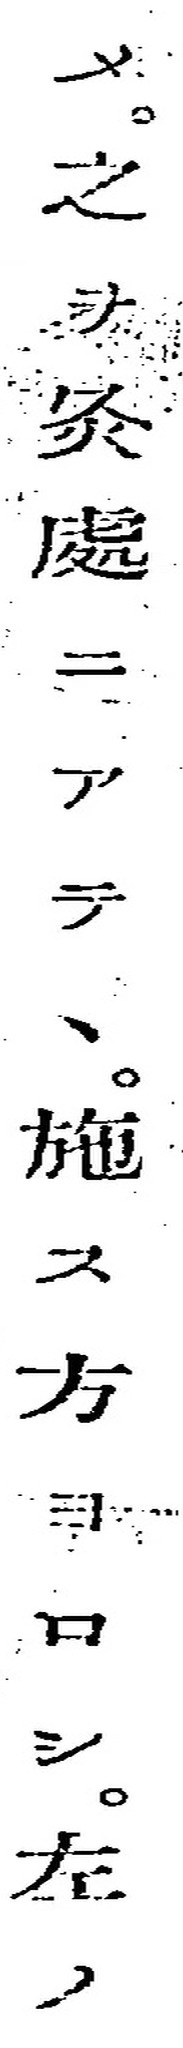め。之を灸處にあてゝ。施す方よろし。左の

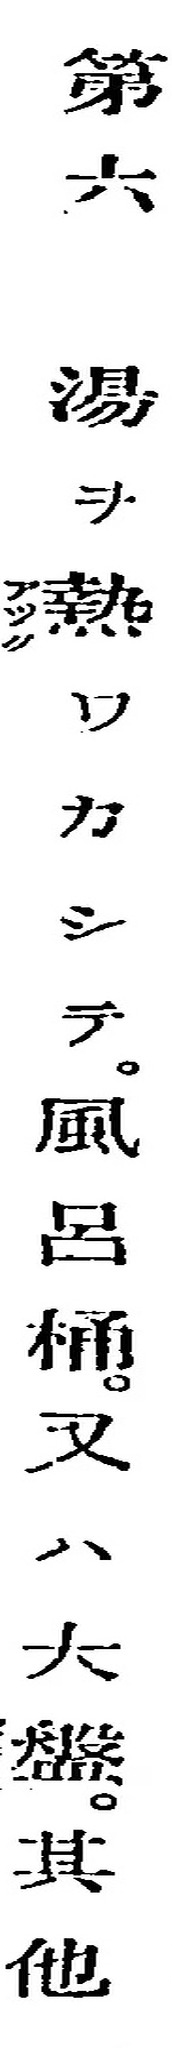第六湯を熱わかして。風呂桶。又は大盤。其他
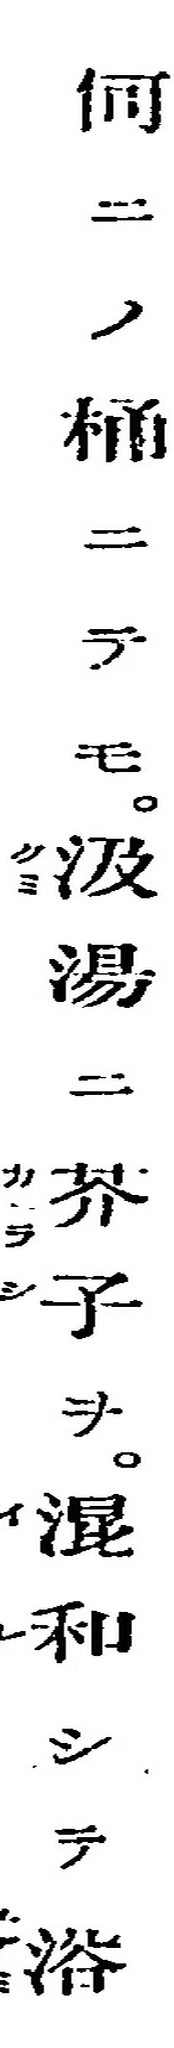何にの桶にても。汲湯に芥子を。混和して浴
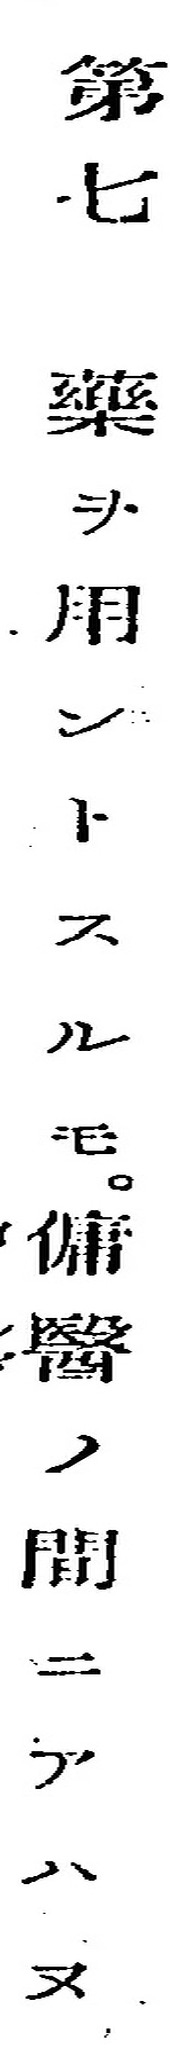第七薬を用んとするも。傭醫の間にあはぬ
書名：駆疫法 : コレラヲヨケ並ニナホスシカタ
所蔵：国立国会図書館 National Diet Library, JAPAN
